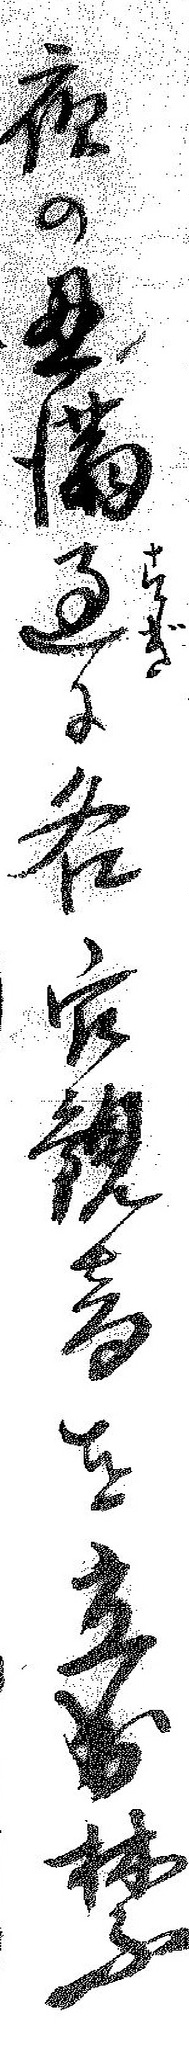夜の丑満過に各穴観音を立出禁
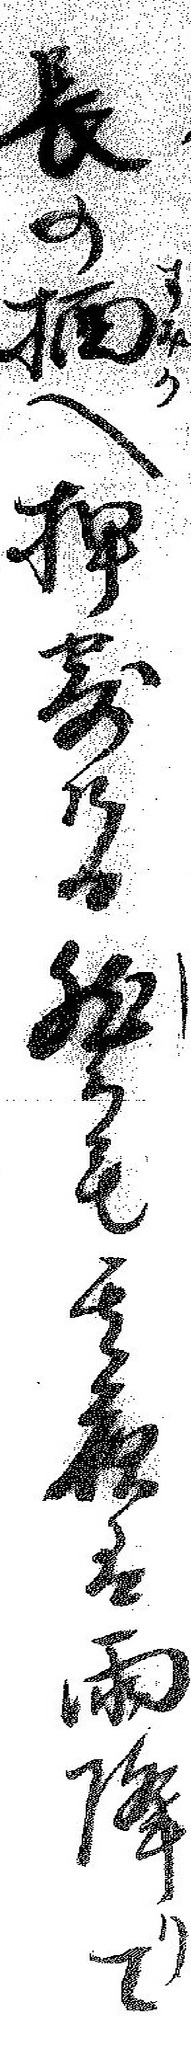長の栖へ押寄ける然かも其夜は雨降りて
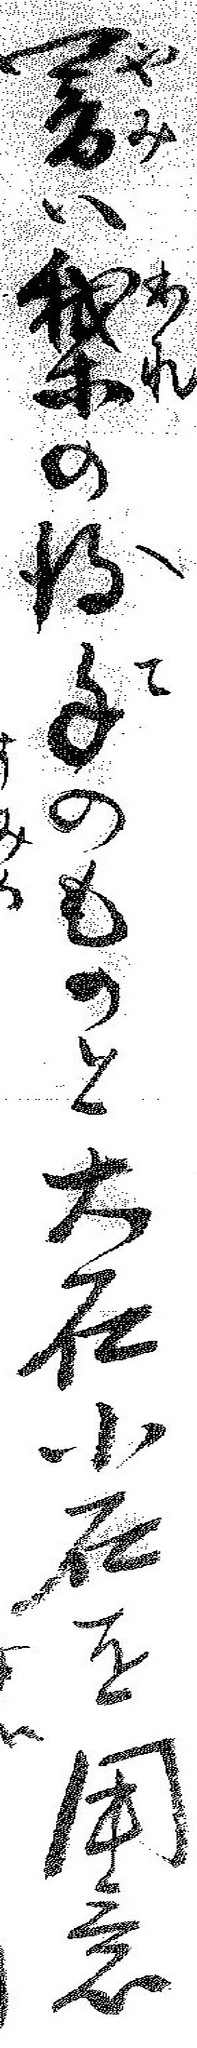闇は我等の得手のものと大石小石を用意
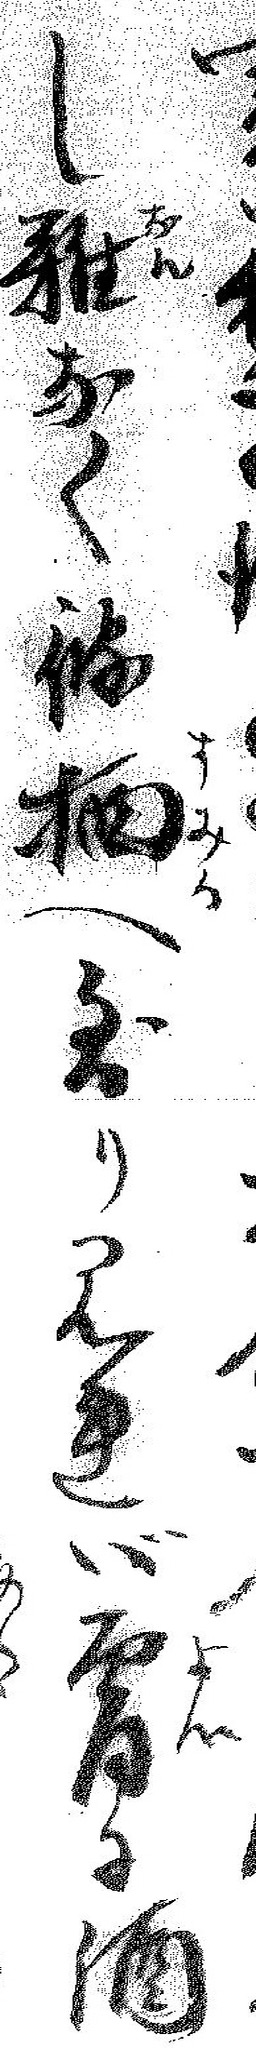し難なく彼栖へ至り見れば宵に酒
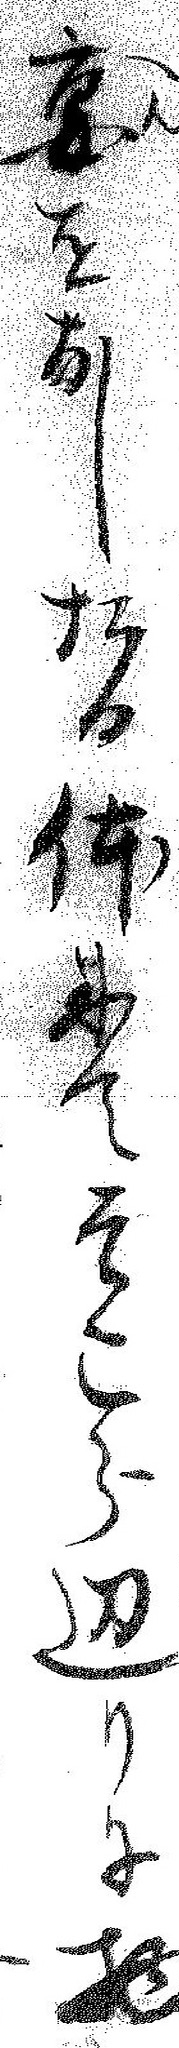宴をなしたる体にてそこら辺りに物
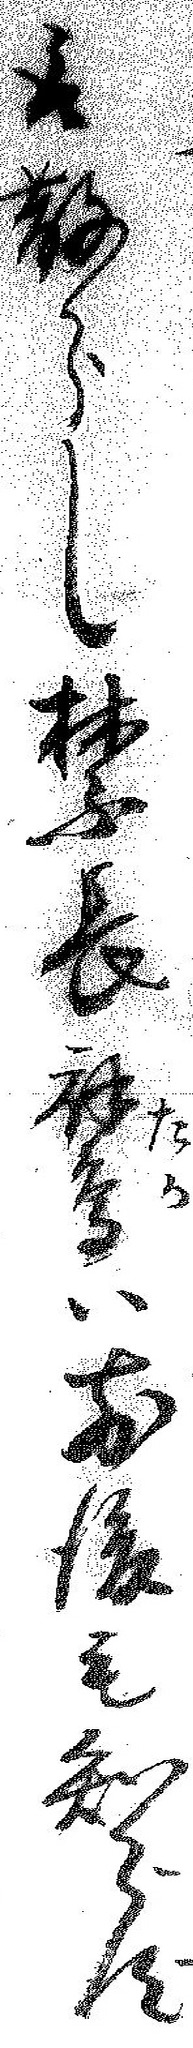取散らし禁長鷹は前後も知らず
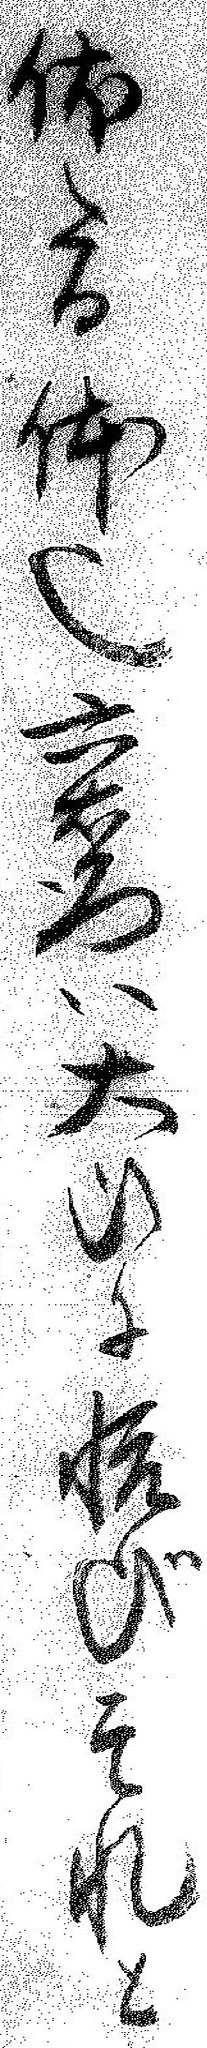伏たる体也六右衛門は大ひに悦びそれと

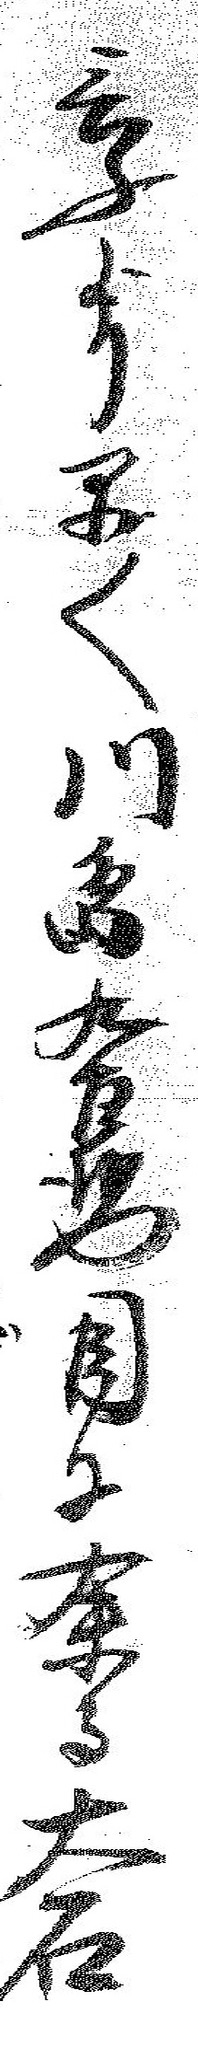言ふより早く川島九左衛門目に余る大石
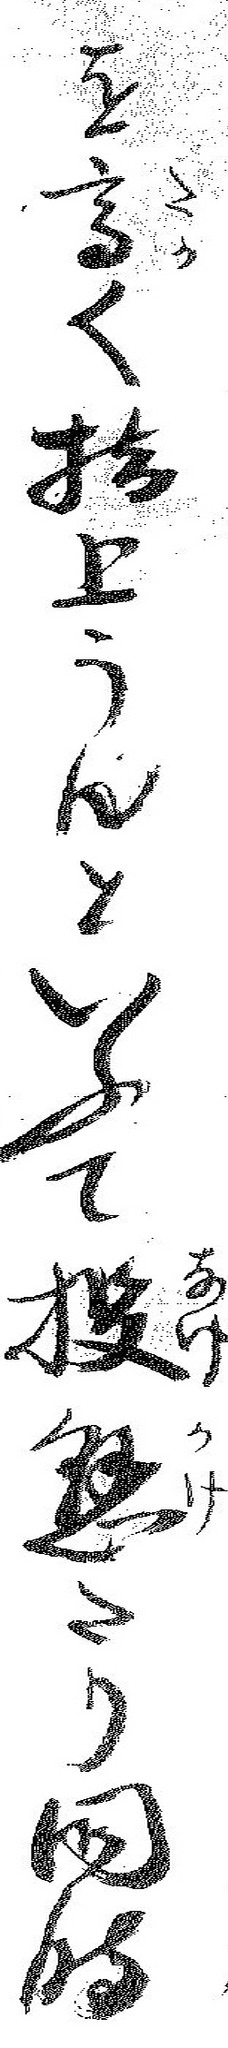を高く指上うんといふて投懸たり同時
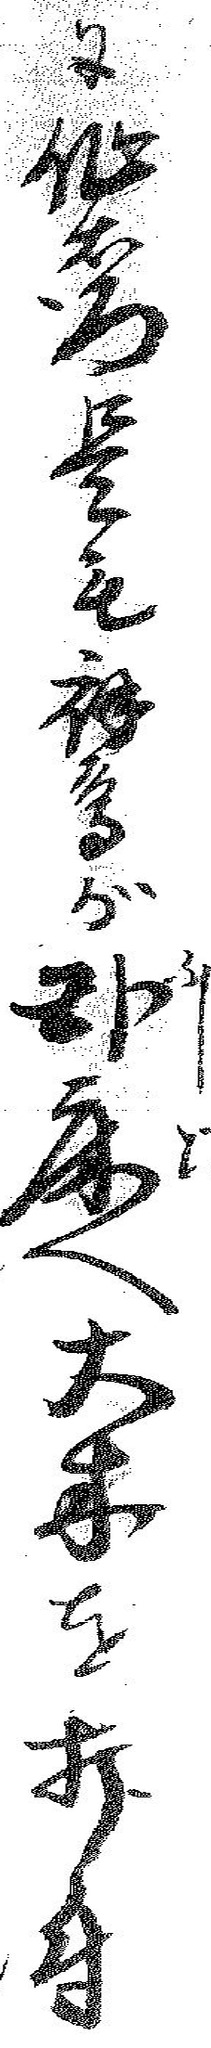に作右衛門是も鷹が臥床へ大木を打付
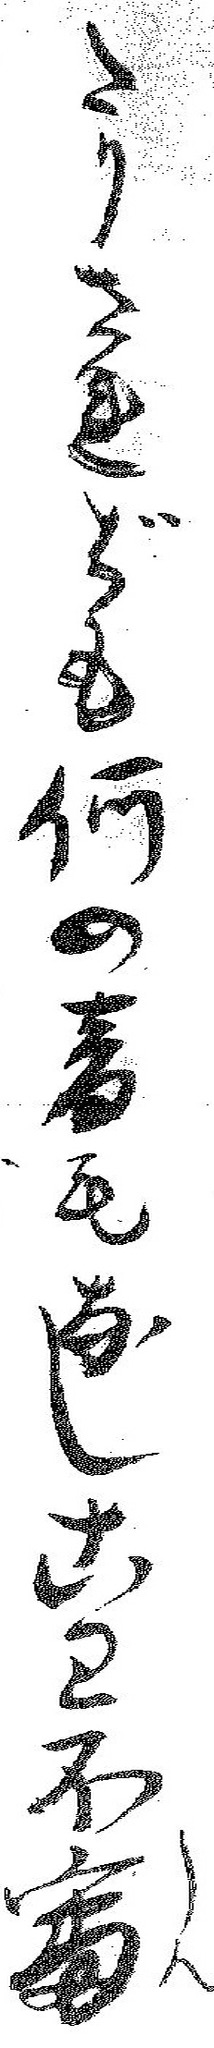たりされども何の音もなしこわ不審
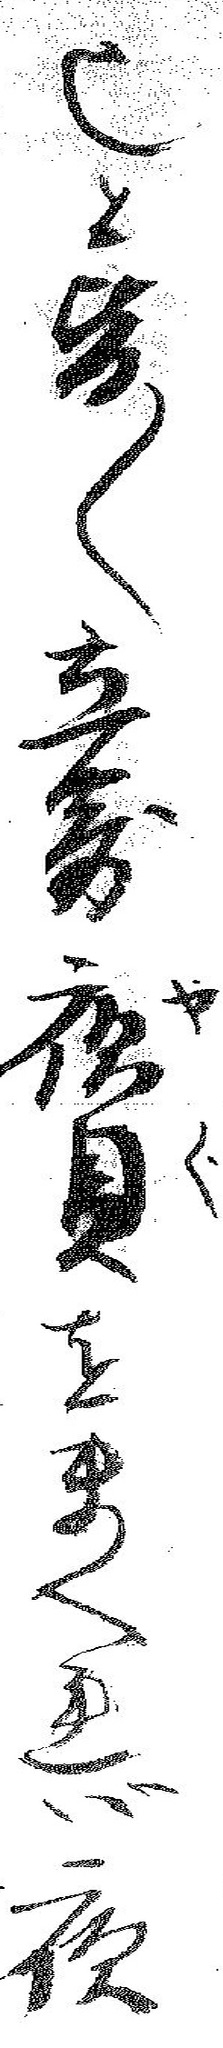也と皆〳〵立寄夜具をまくれば夜
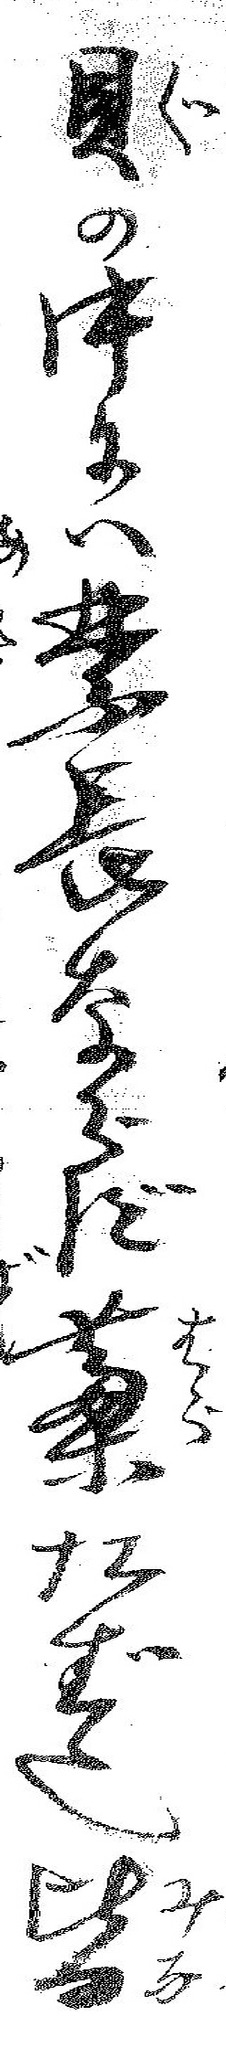具の中には禁長ならず藁たば也皆
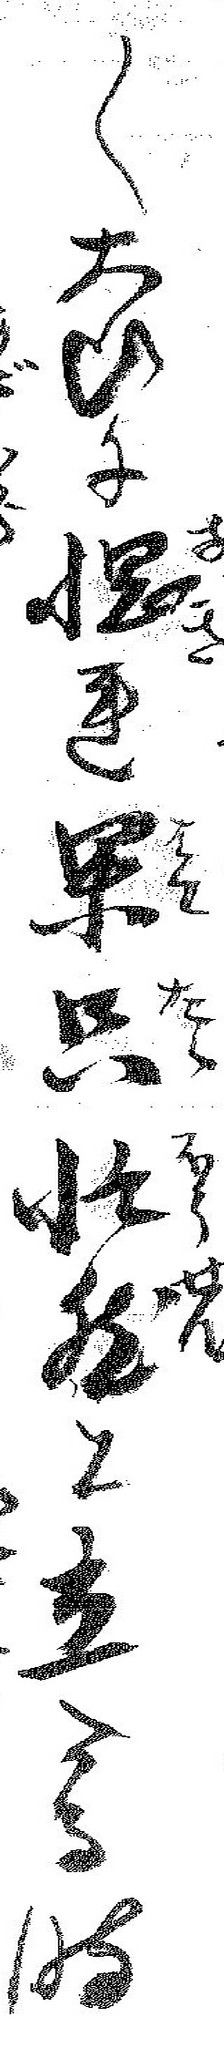〳〵大ひに惘れ果只忙然と立たる時
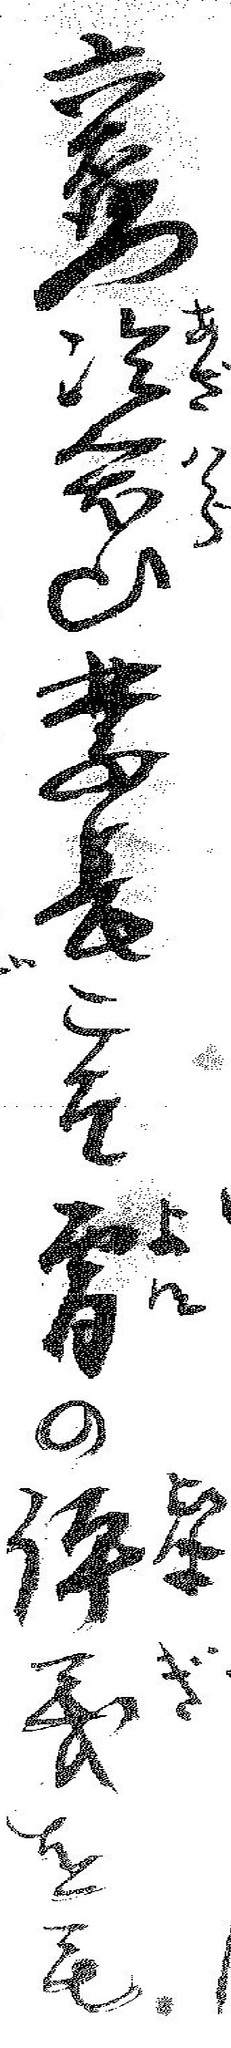六右衛門冷笑ひ禁長こそ宵の評義をも
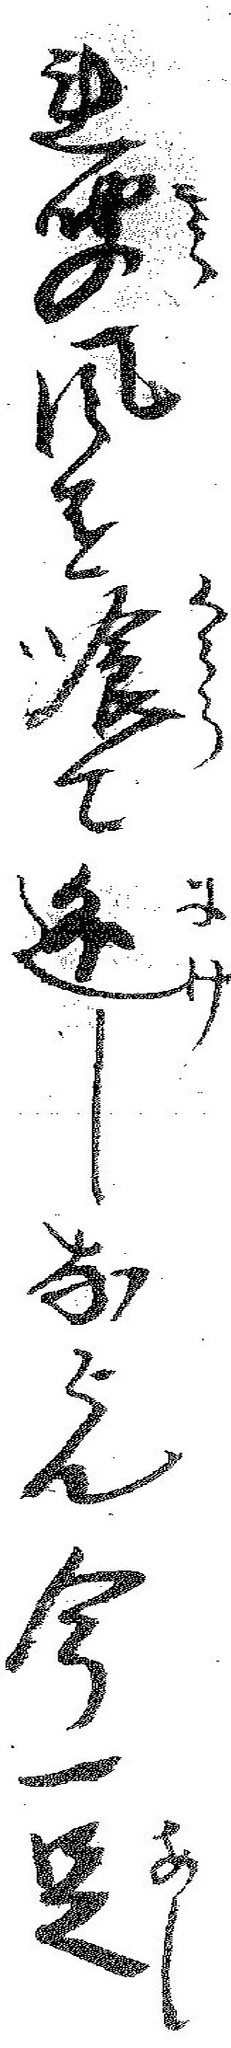れ聞風を喰て逃しならん今一足
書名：近頃古狸珍説　礼義智信
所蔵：徳島県立図書館
